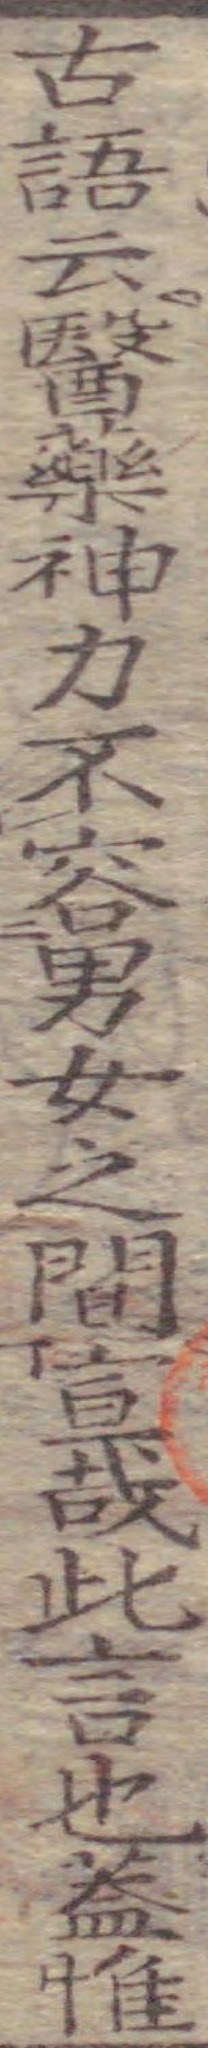古語云。医薬神力不容男女之間。宣哉此言也。益惟
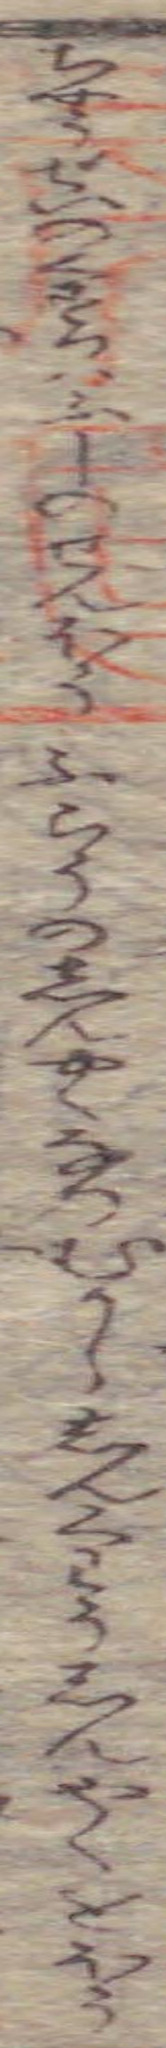ちやうせいのくすりはふしのせんほうふらうのしんやくなりむかししんくわうしんやくをほう
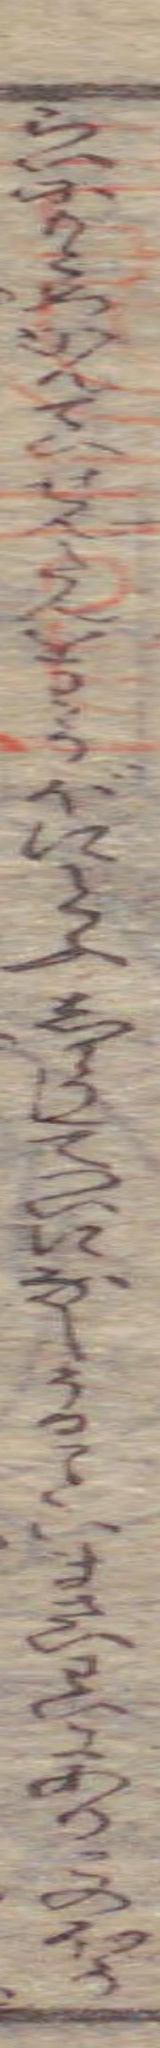らいにもとめかんていせんたんをわうぼにとふしこうしてついになしうることいまさいわいにありこのほう
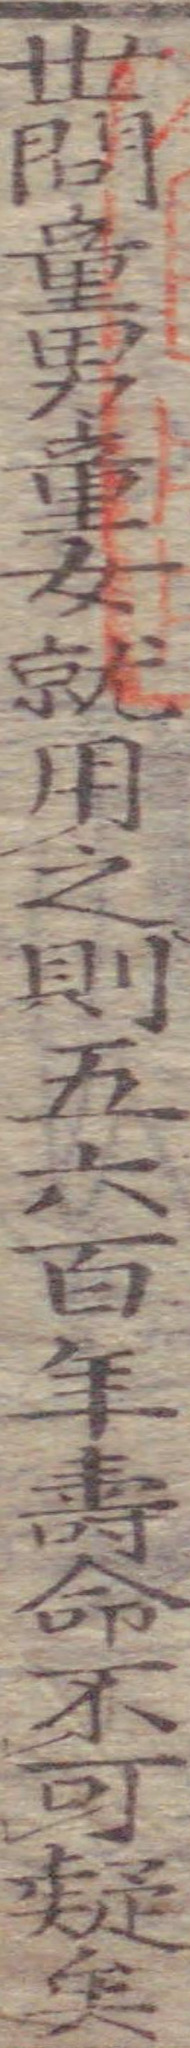世問童男童女就用之。則五六百年寿命不可疑矣
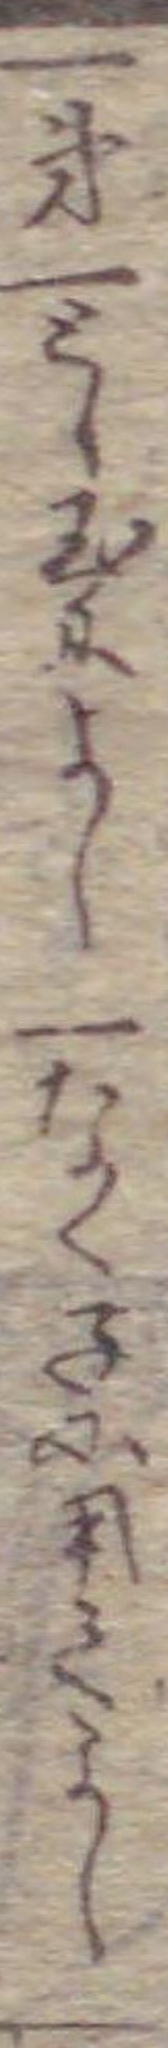一㐧一とし玉によし一なく子に用てよし
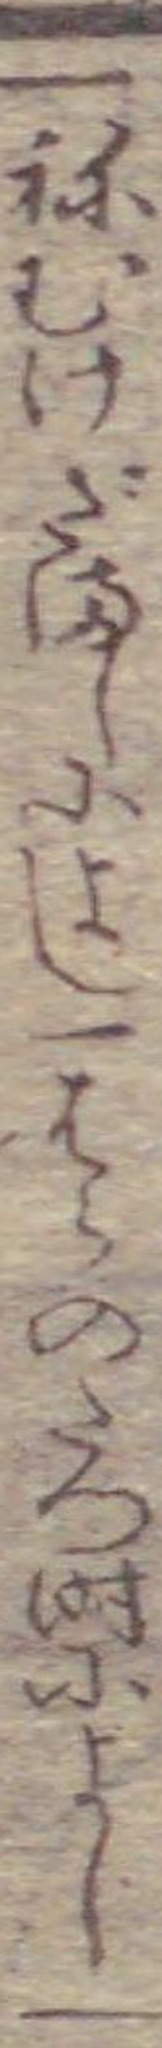一ねむけざましによし一はらのたつ時によし
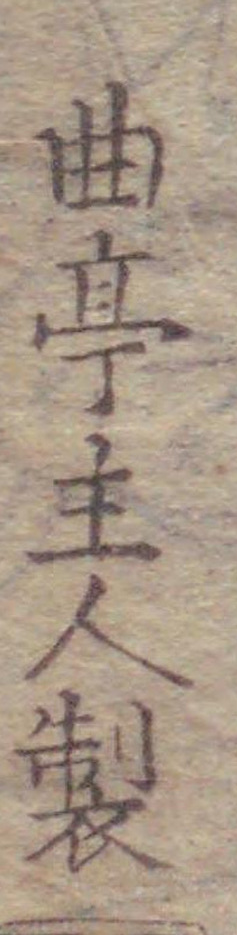曲亭主人製
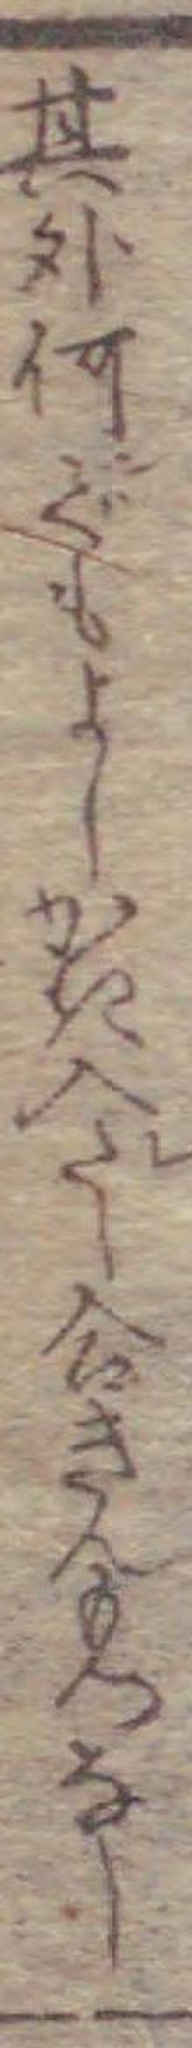其外何でもよしかき入れたし合きんもつなし

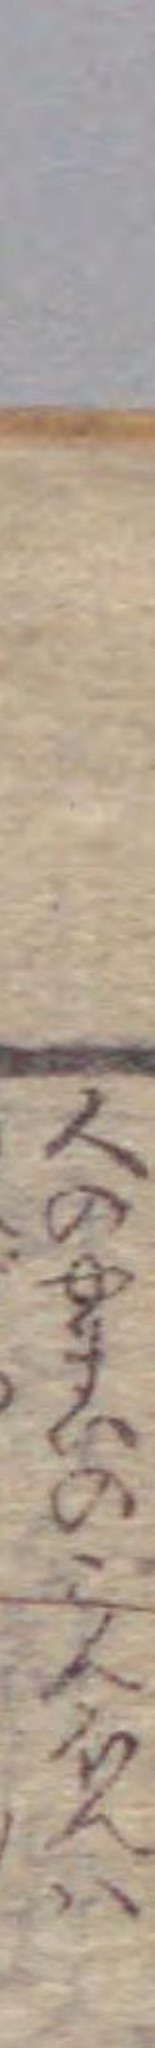人のやまひのこんほんは
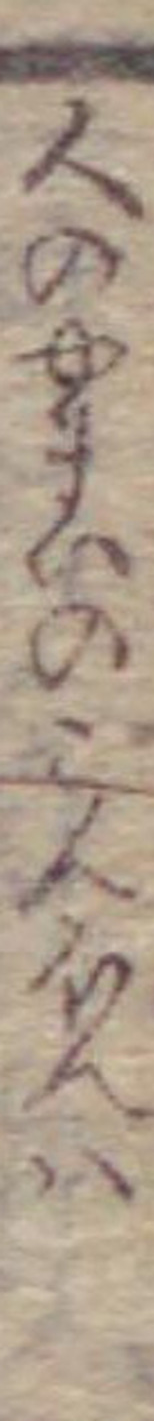人のやまひのこんほんは
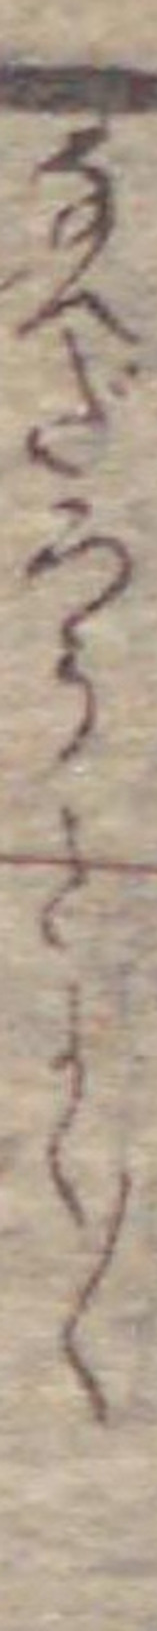なんだろうとよく〳〵
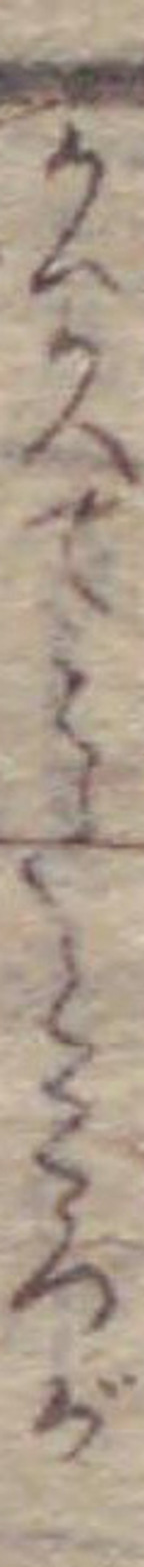かんかへてみたところが
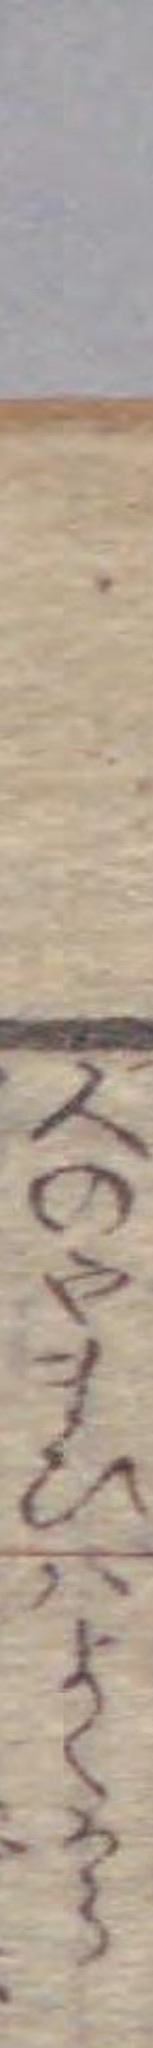人のやまひはよくから
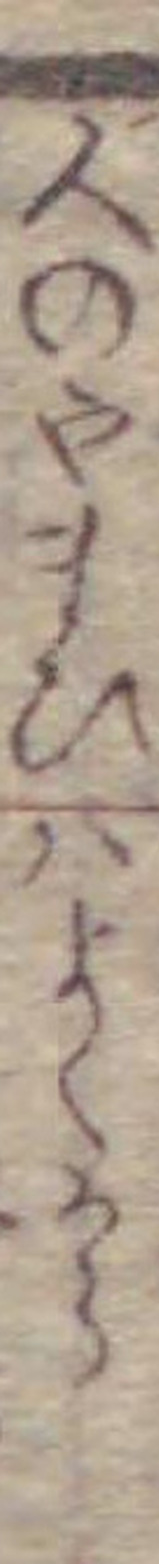人のやまひはよくから
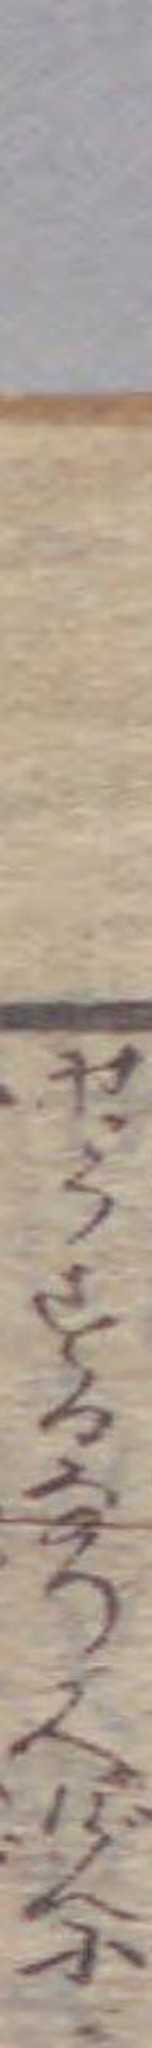せうするなり人げんに
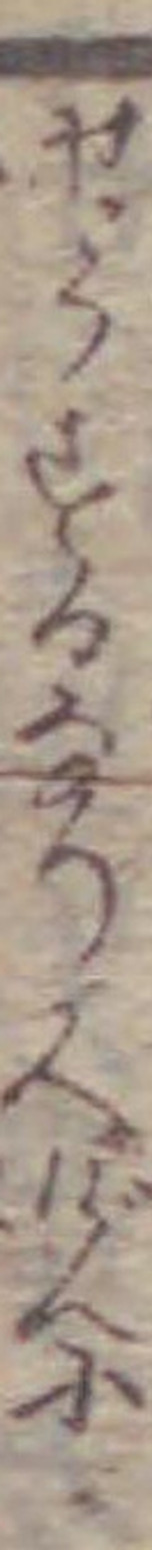せうするなり人げんに
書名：鼻下長生薬 : 3巻
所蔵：国立国会図書館 National Diet Library, JAPAN
